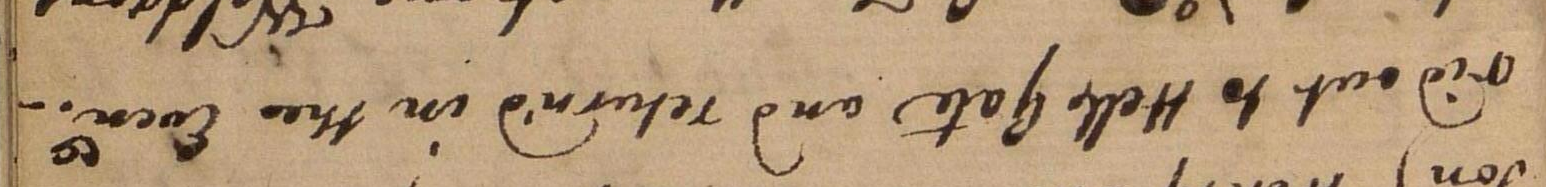rid out to Hells Gate and return'd in the Even^g.
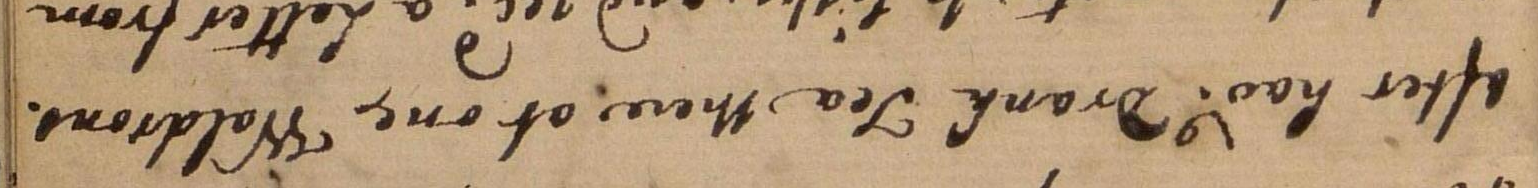after hav^g. Drank Tea at one Waldrons.
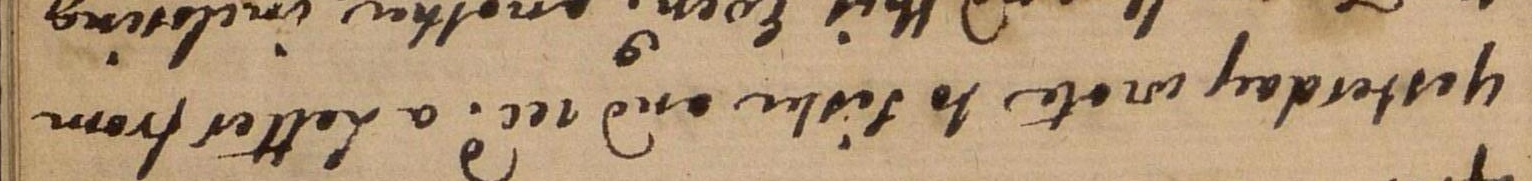yesterday wrote to Sister and rec^d. a Letter from
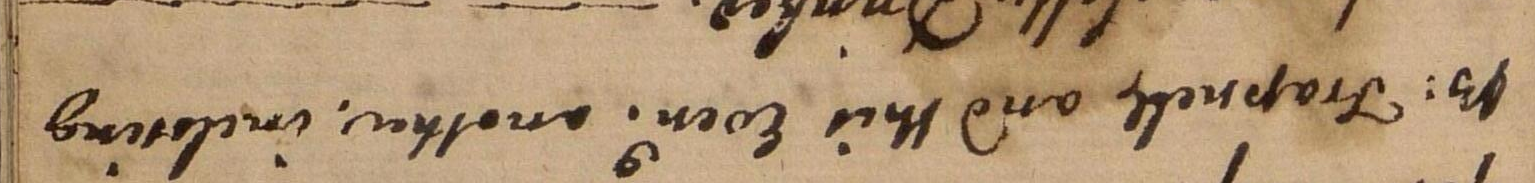B: Frapnell and this Even^g. another. including
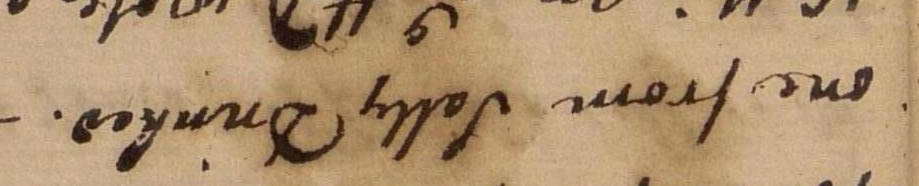one from Sally Drinker. -
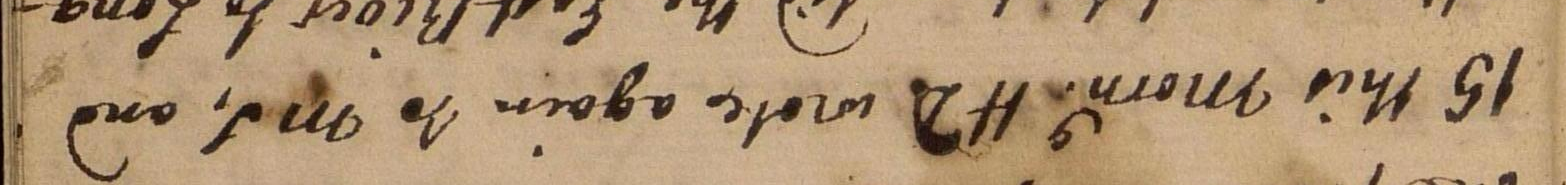15 this Morn^g. HD wrote again to MS. and
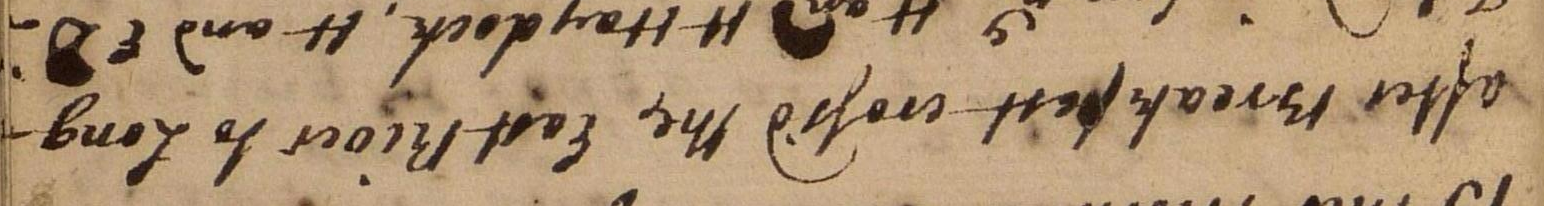after Breakfast cross'd the East River to Long-
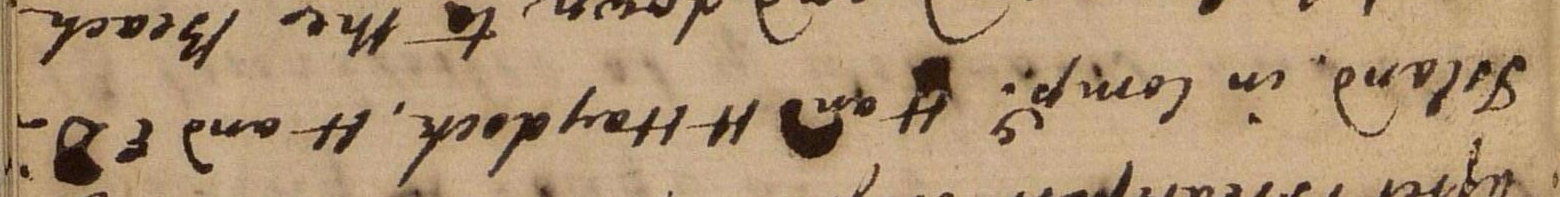Island, in Comp^y. H and H Haydock, H and ED -
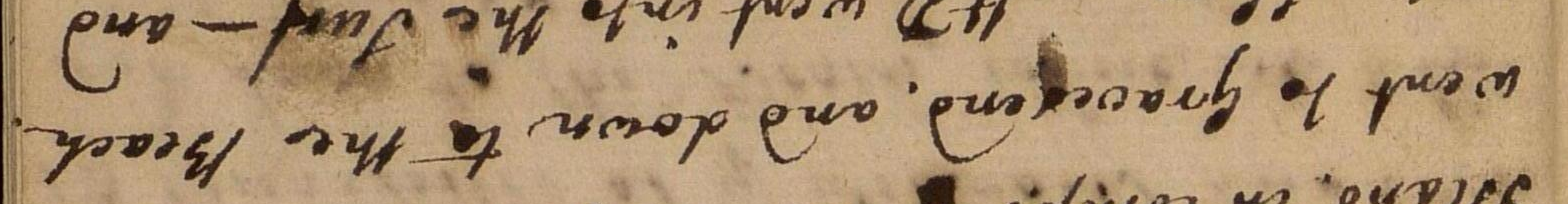went to Gravesend, and down to the Beach
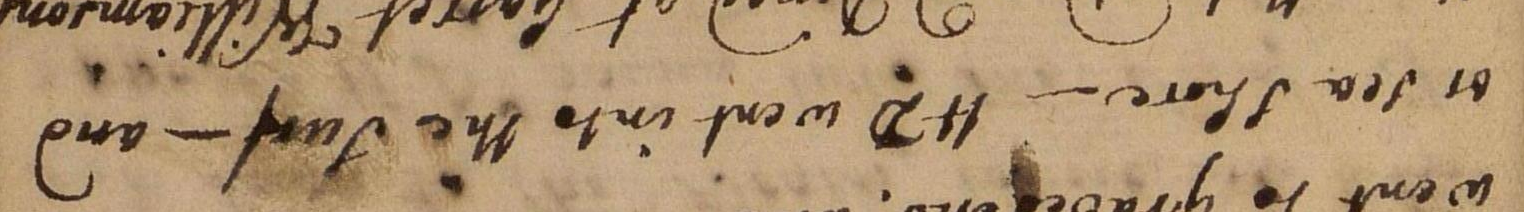on Sea Shore - HD went into the Surf - and
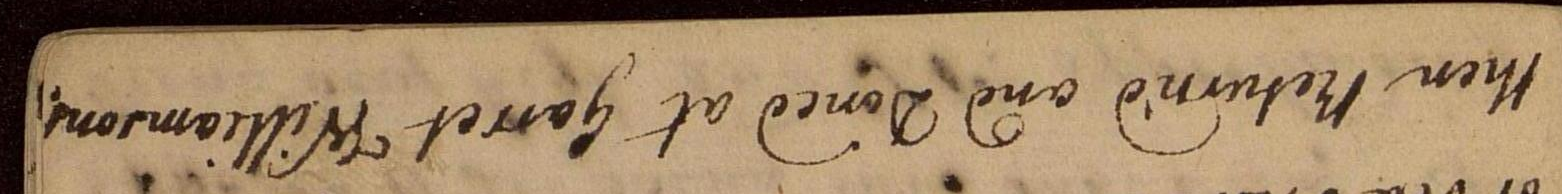then Return'd and Dined at Garret Williamsons
